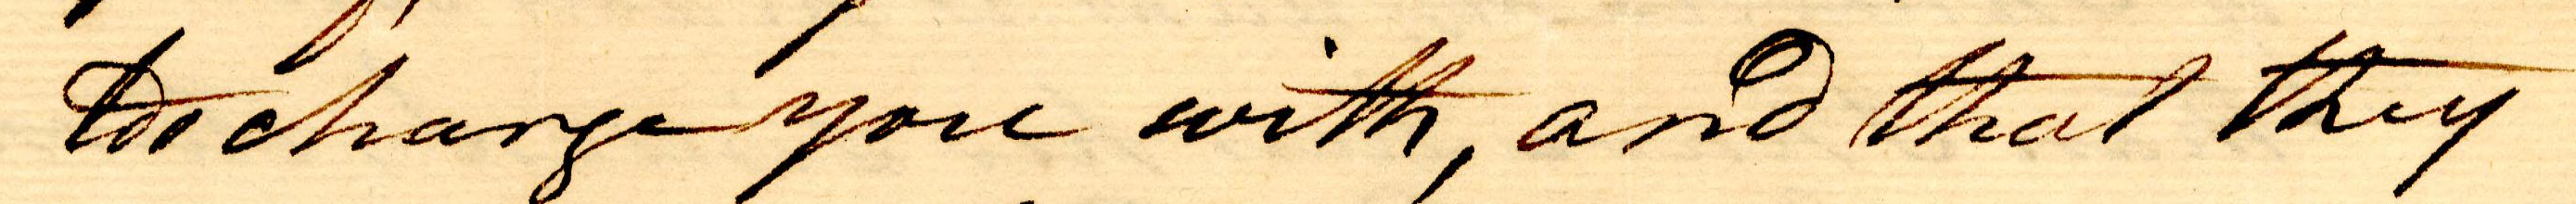too charge you with, and that they
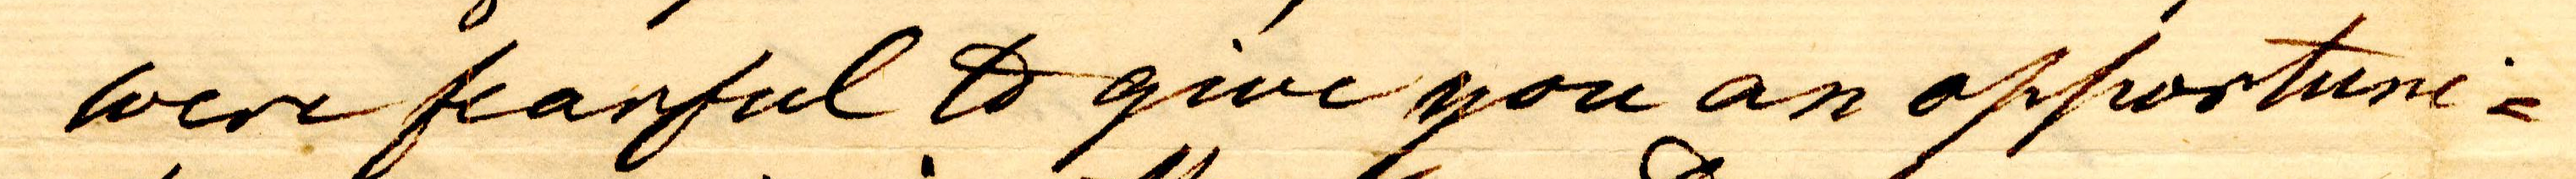were fearful to give you an opportuni-
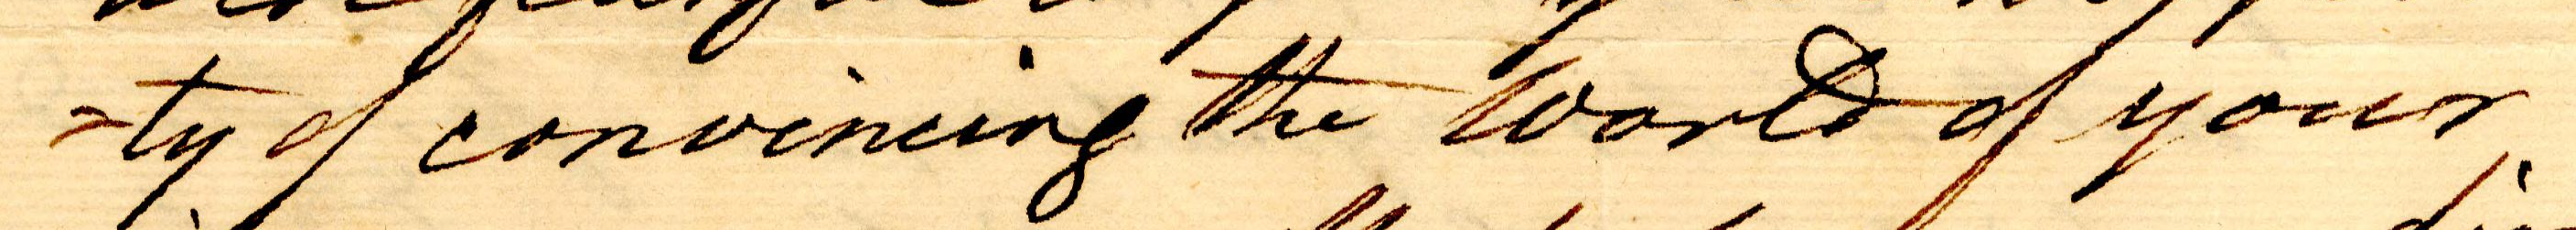-ty of convincing the World of your
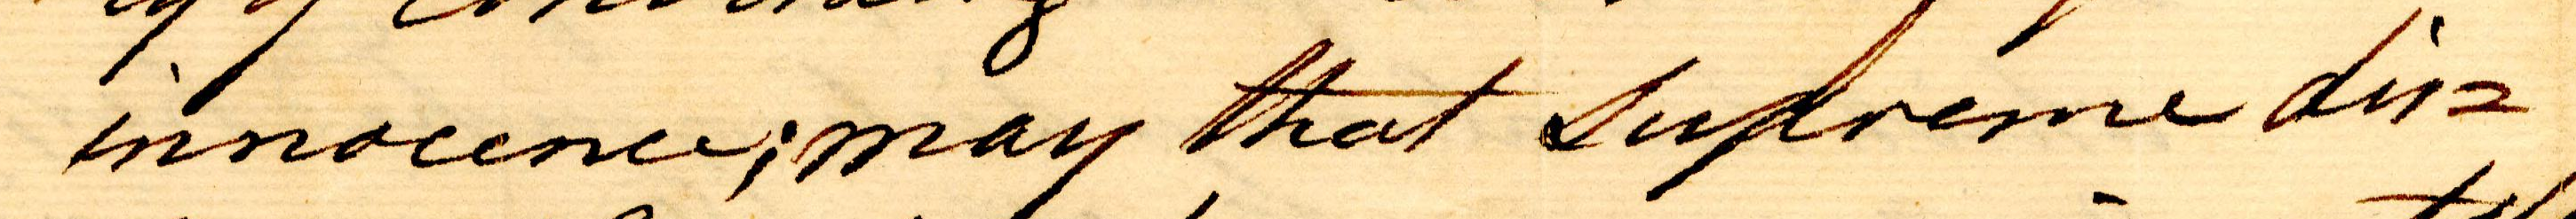innocence; may that supreme dis-
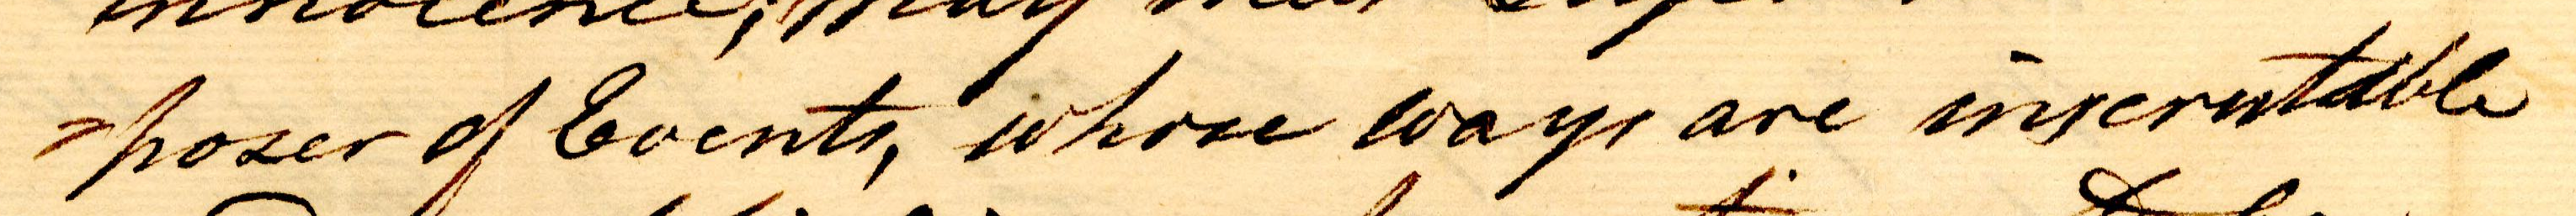-poser of Events, whose ways are inscrutable
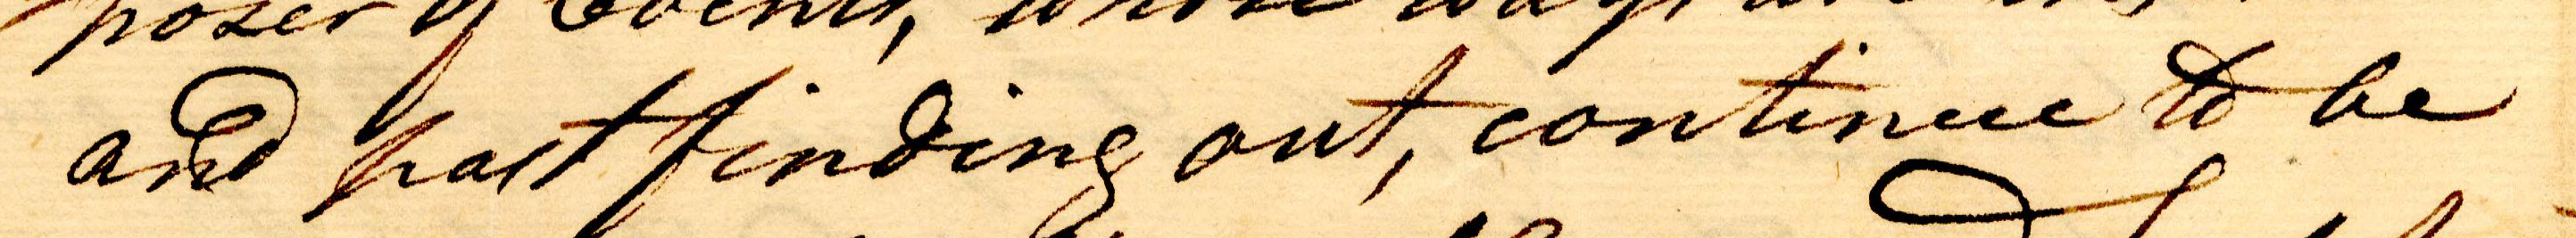and past finding out, continue to be
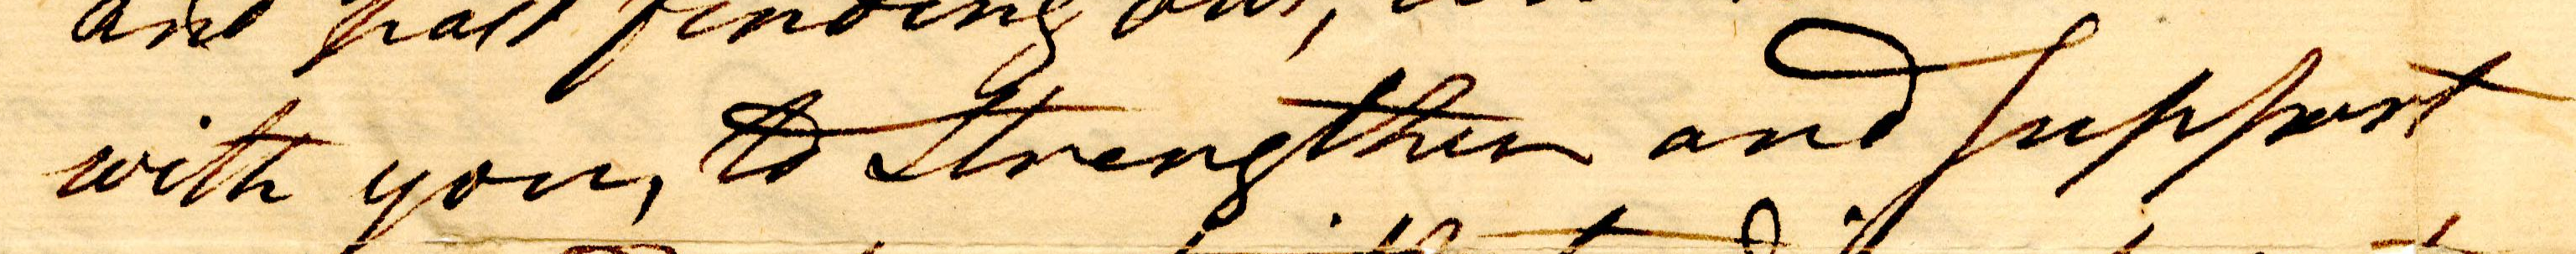with you, to Strengthen and Support
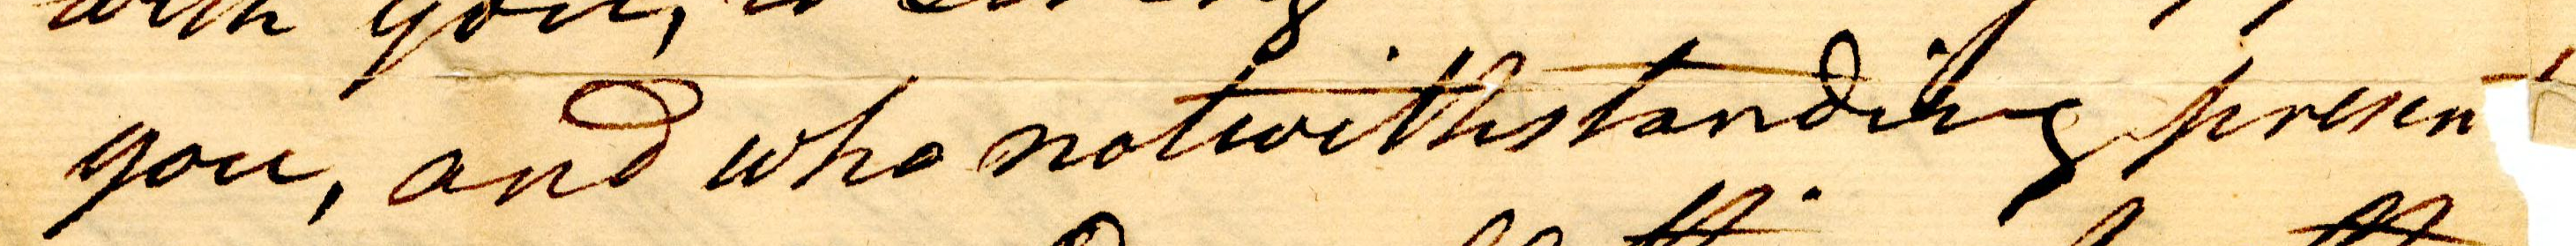you, and who notwithstanding present
